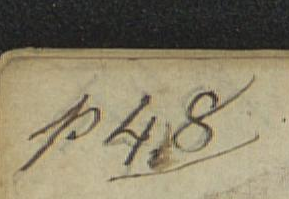p48
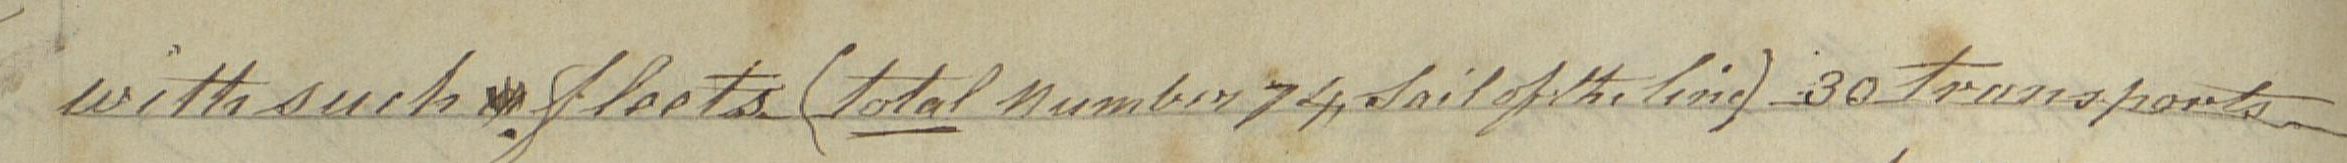with such fleets (total number 74 Sail of the line) 30 transports
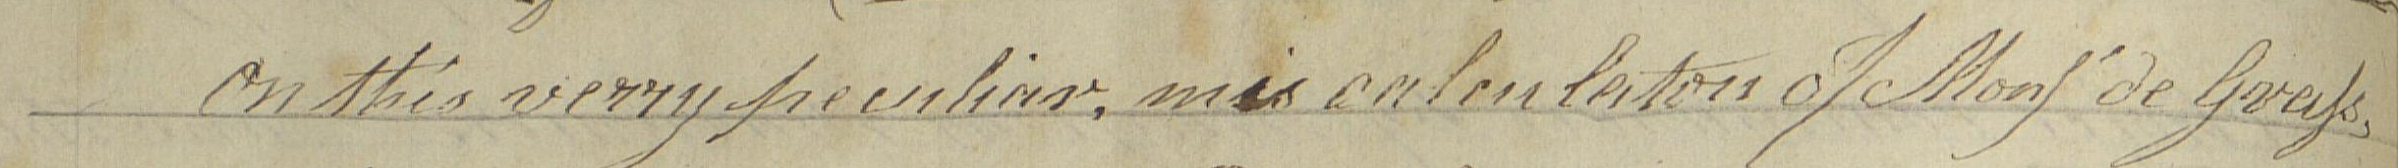On this verry peculiar, miscalculaton of Mons^r de Grass,
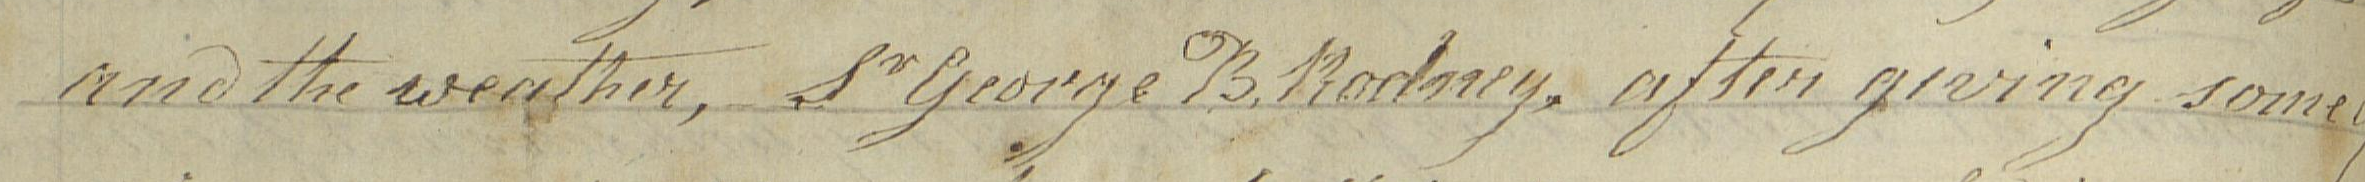and the weather, S^r George B Rodney. after giving some of
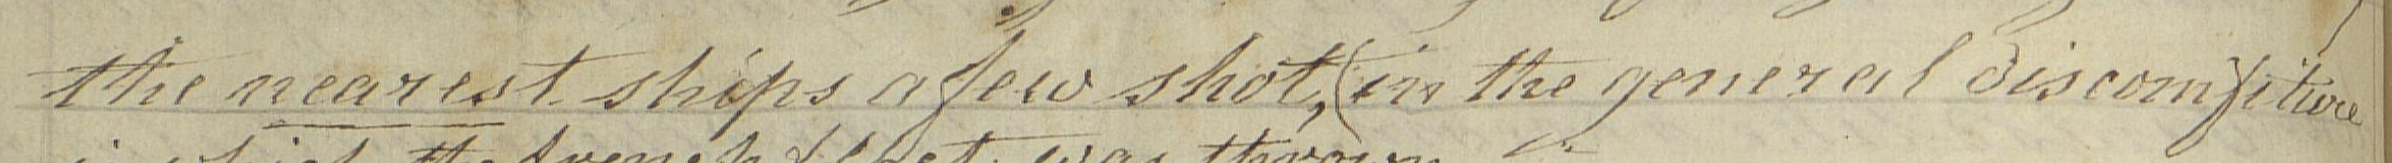the nearest ships a few shot, (in the general discomfiture
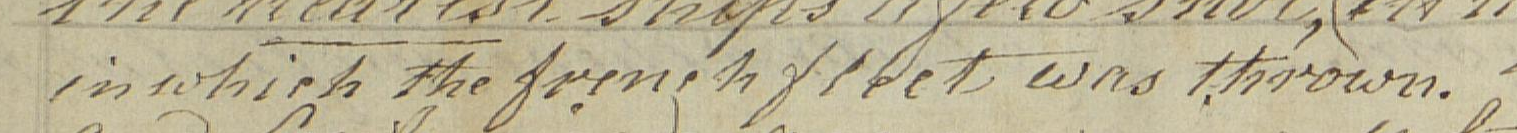in which the french fleet was thrown.
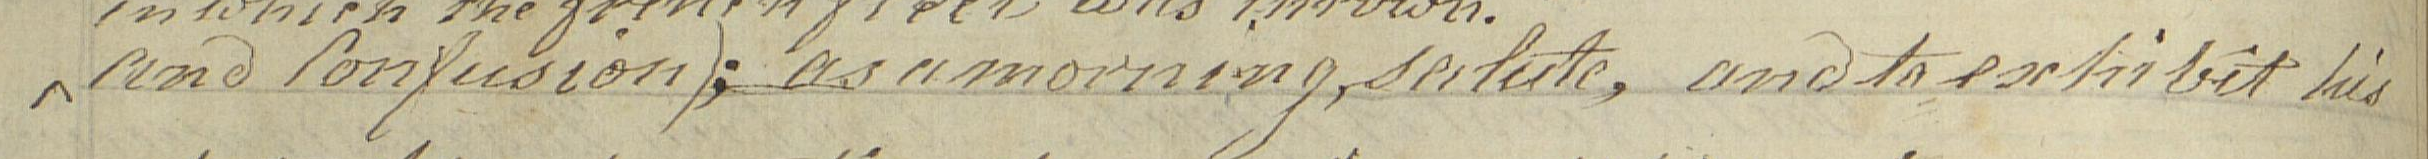^ and Confusion); as a morning, salute and to exhibit his
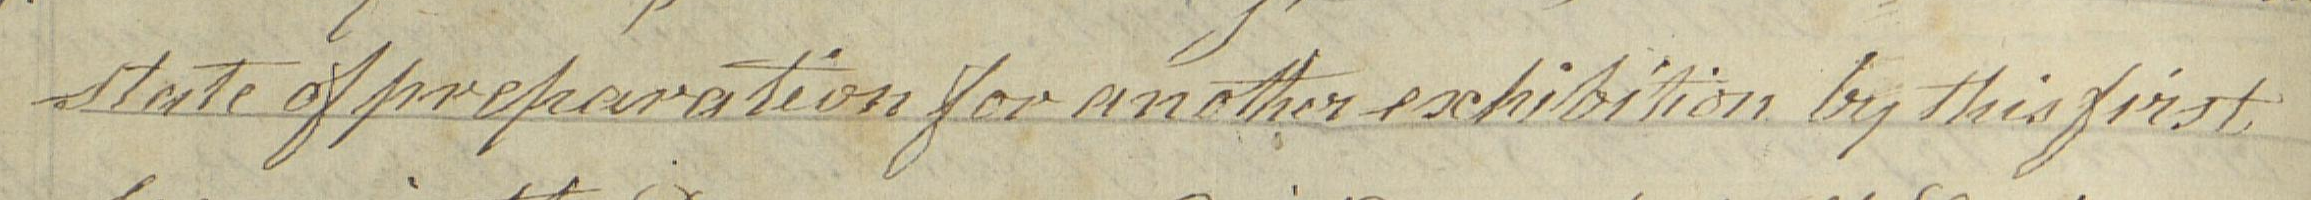state of preparation for another exhibition by this first
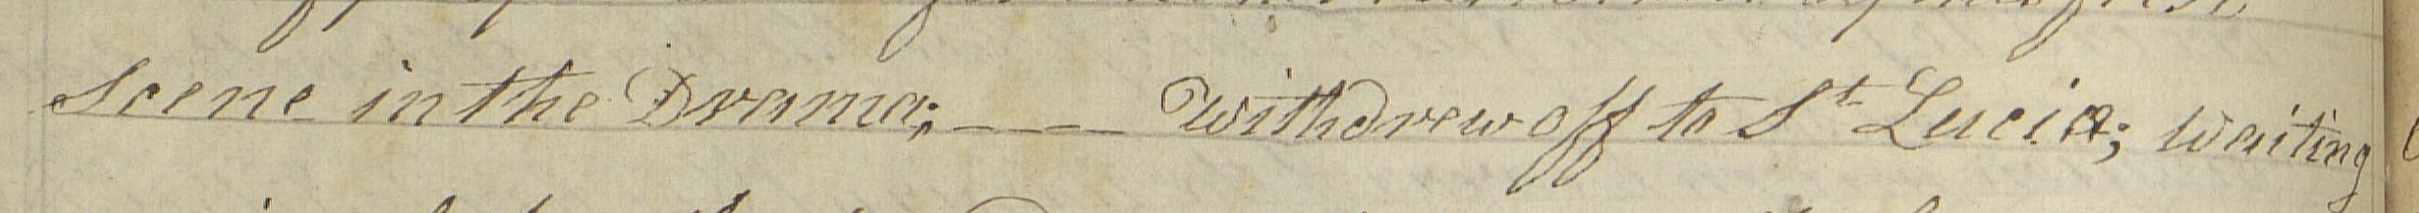scee in the Drama; withdrew off to S^t. Lucia; Waiting
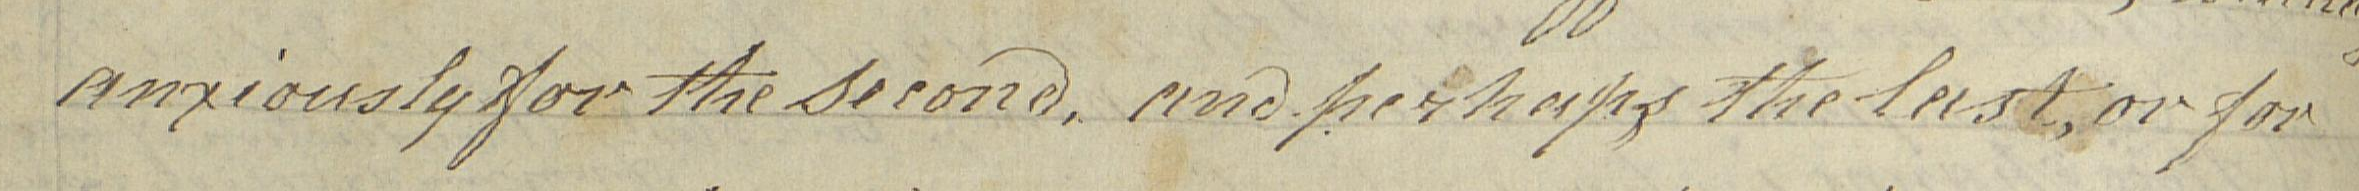anxiously for the second, and perhaps the last, or for
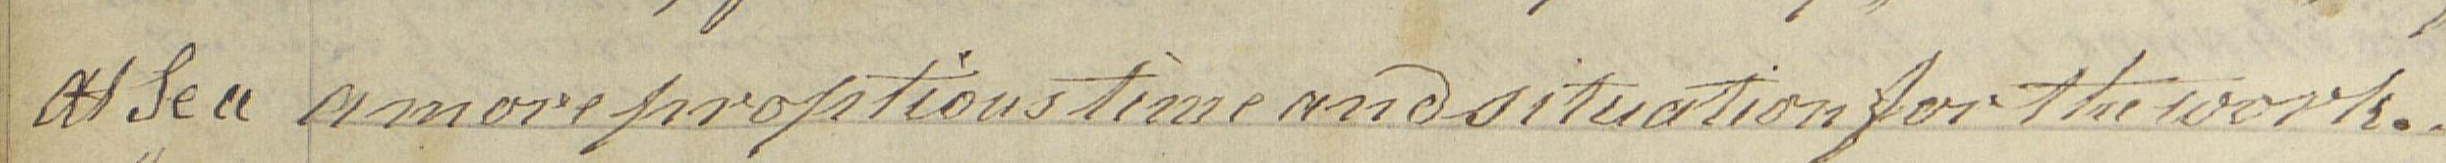At Sea a more proptious time and situation for the work.
